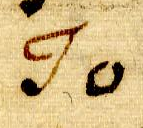To
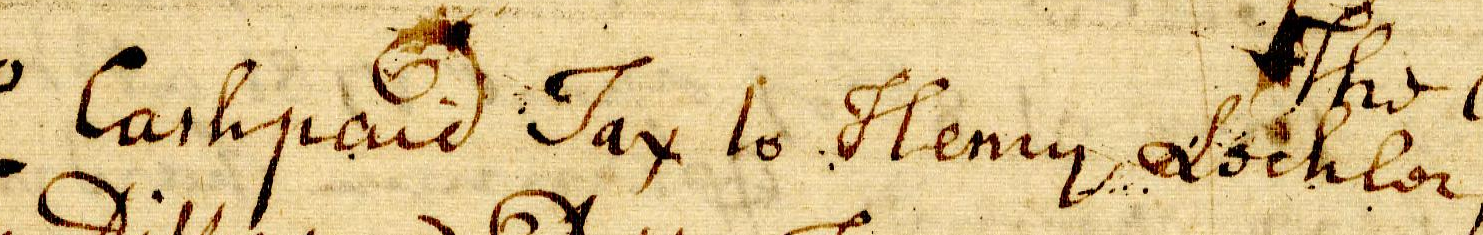Cash paid Tax to Henry Lochler
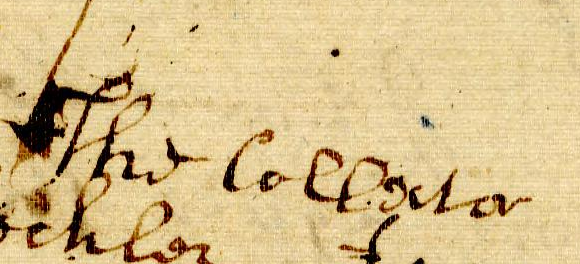The Collector
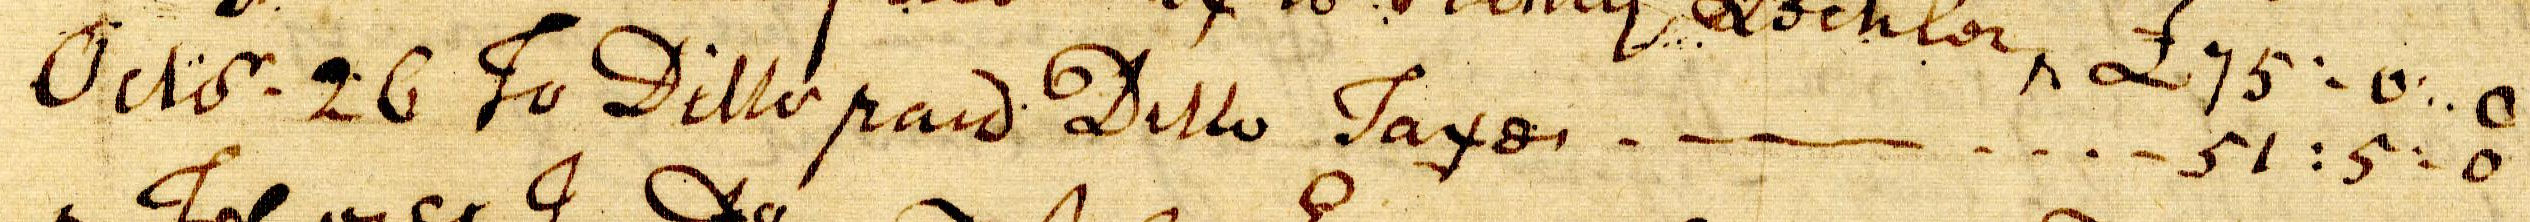Octo^r. 26 to Ditto paid Ditto Taxes--....51:5:0
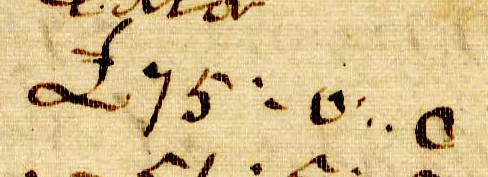£75:0..0
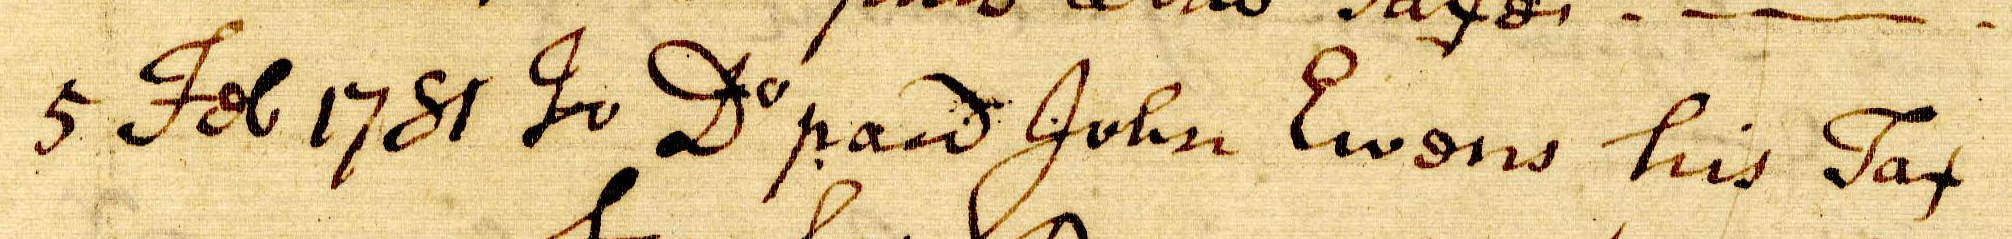5 Feb 1781 to D^o paid John Ewens his Tax
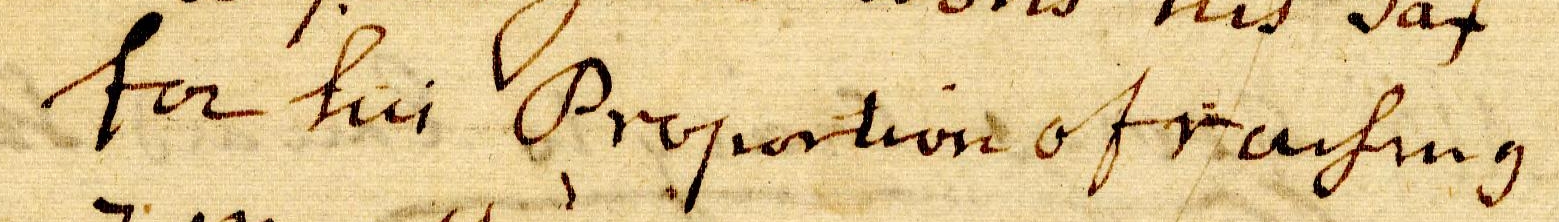for his Proportion of raising
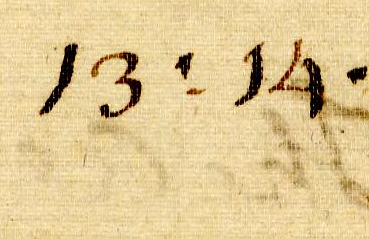13:14.4
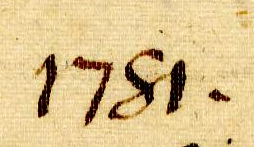1781.
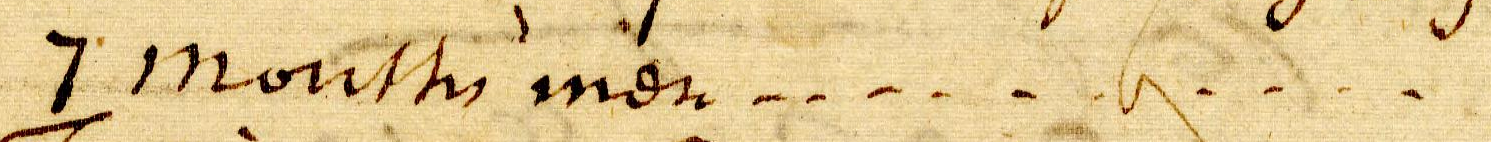7 Months men.........
